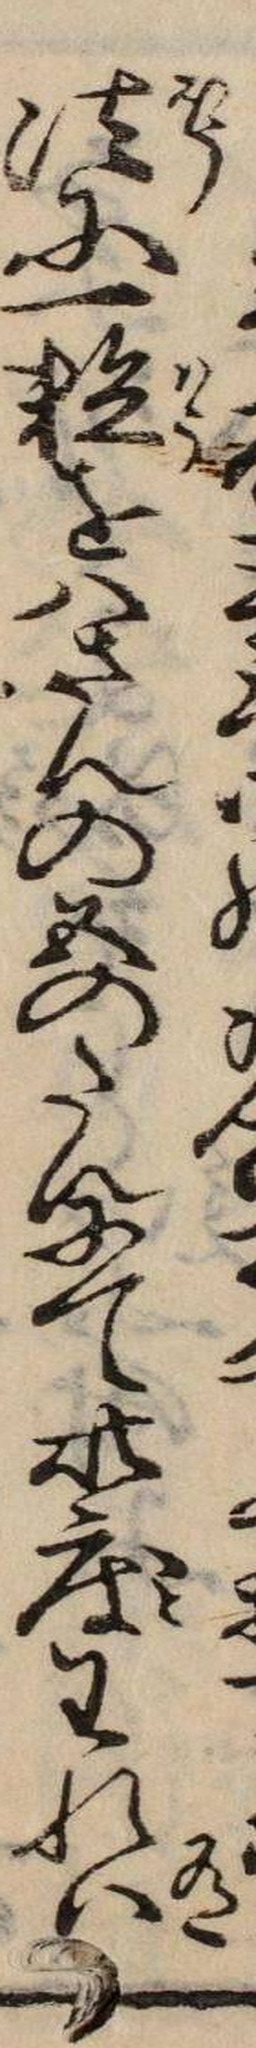法に一粒を八さんの五のたんにて卅度われは
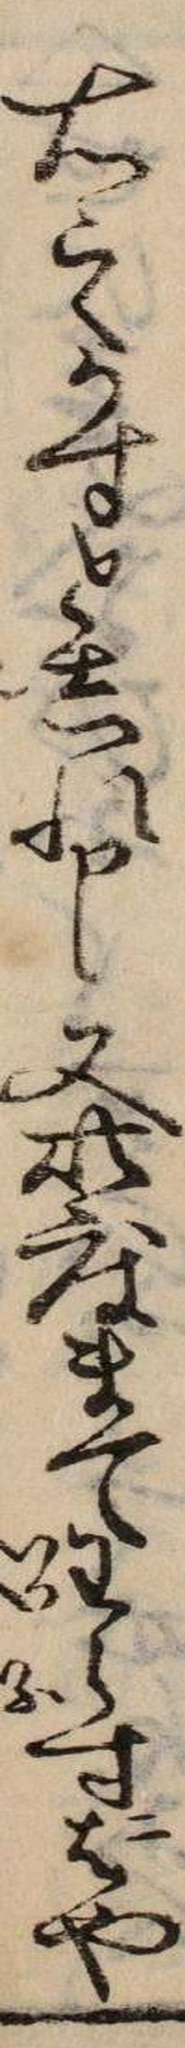右之かすとしれ申候又卅度まてわらすにはや
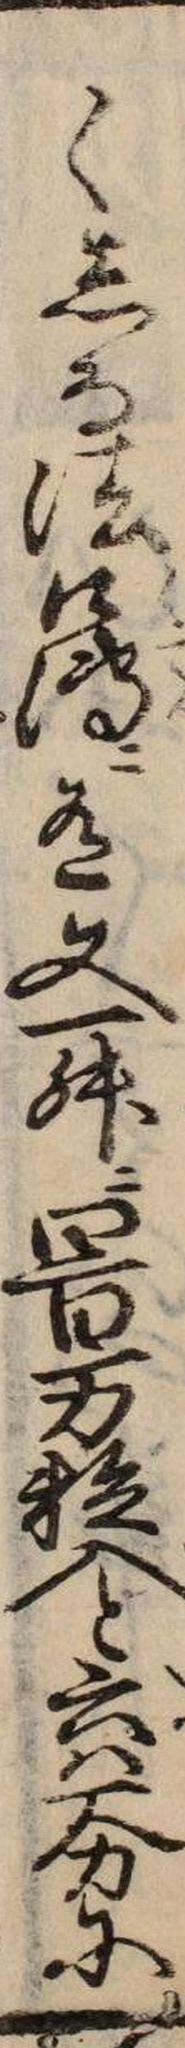くしる法口伝に有又一升に四百万粒入と云は一分に
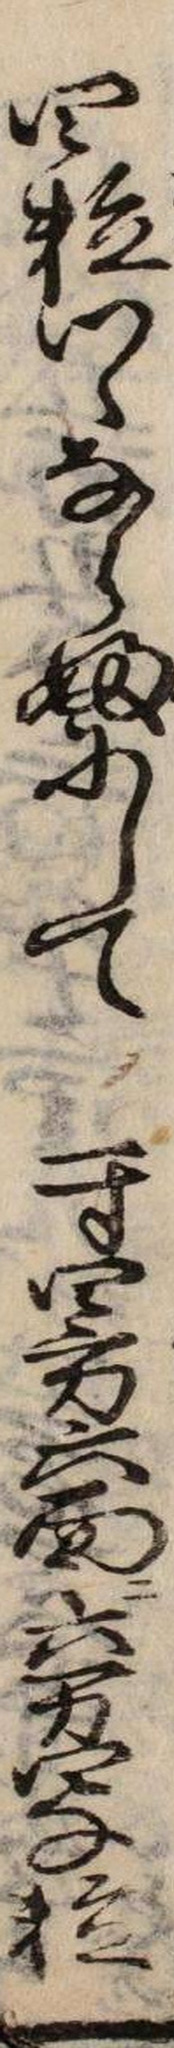四粒つつならふにして一寸四方六面に六万四千粒
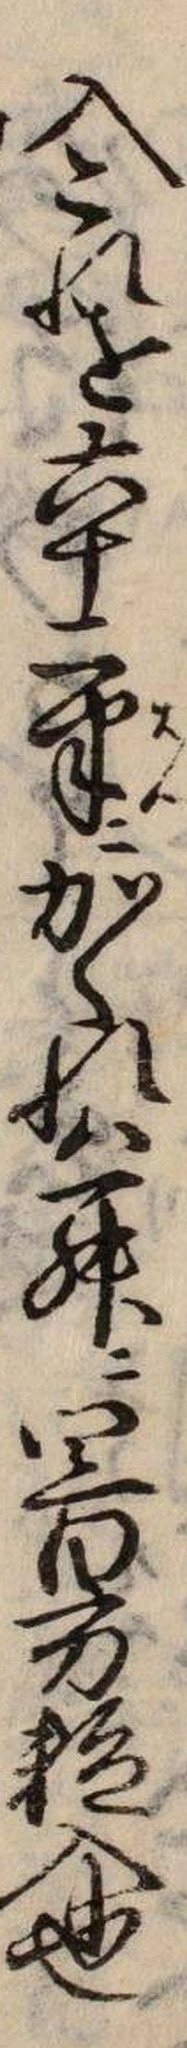入これを六十二半にかくれは一升に四百万粒入也
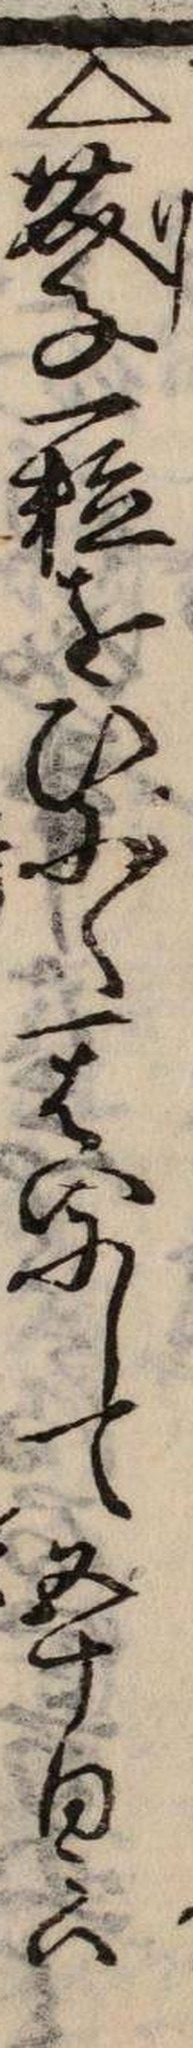△芥子一粒をひにひに一はいにして五十日には
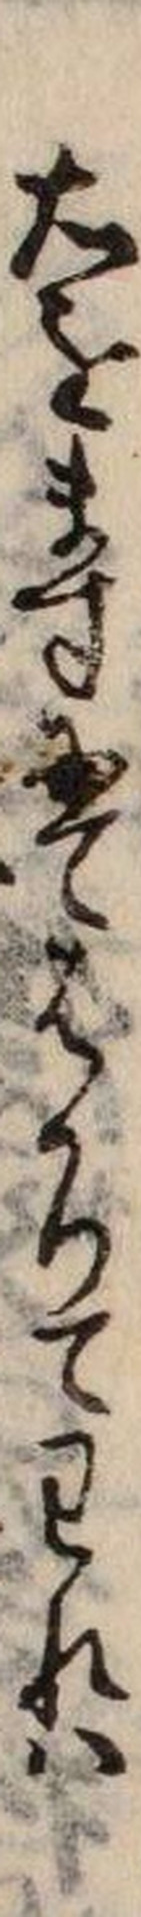右をますにてはかりてわれは
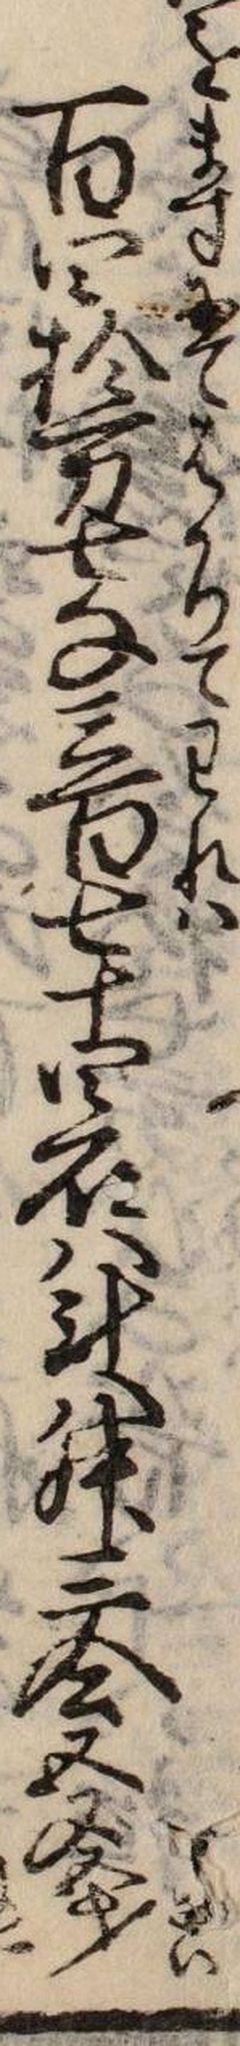百四拾万七千三百七十四石八斗八升三合五勺五才有
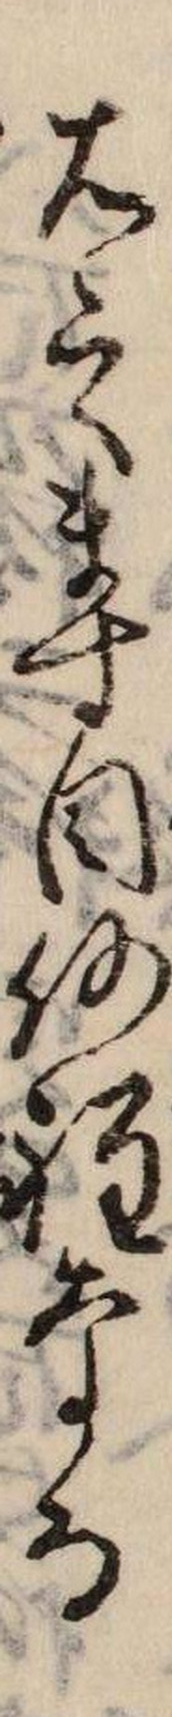右之ます目何程なる
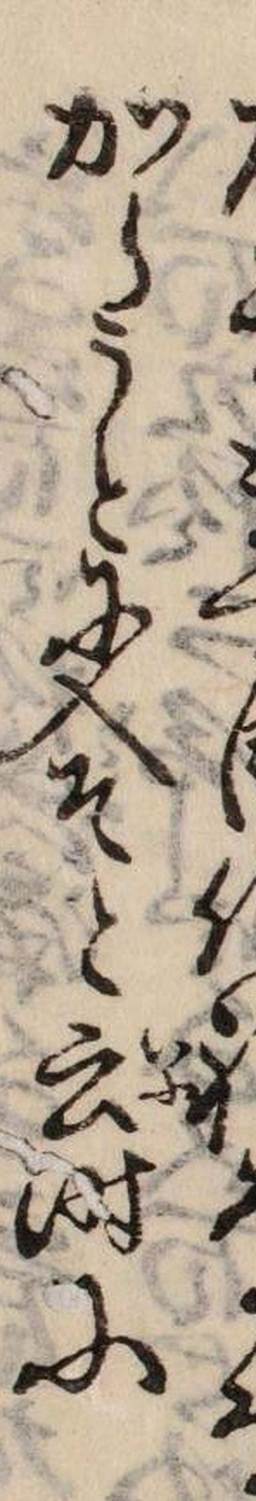加らうとに入そと云時に
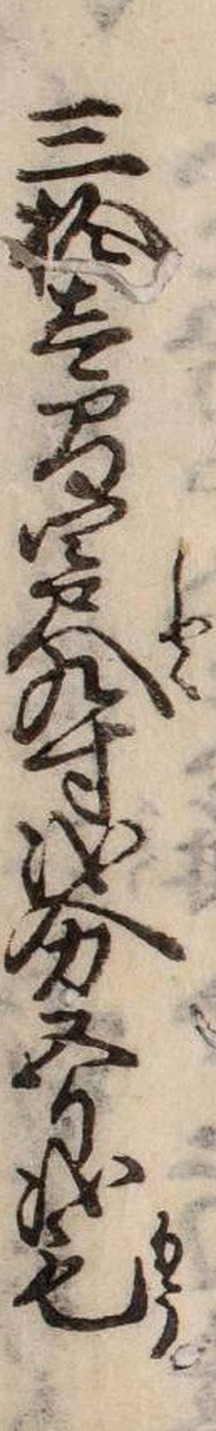三拾壱間四尺九寸弐分五り弐毛

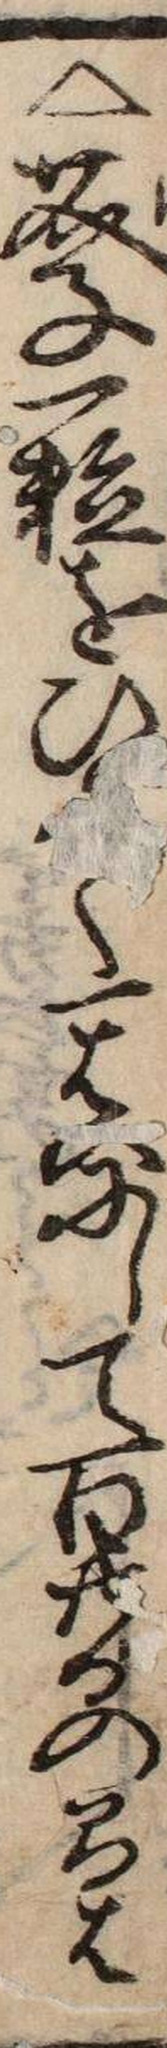△芥子一粒をひにひに一はいにして百廿日の間は
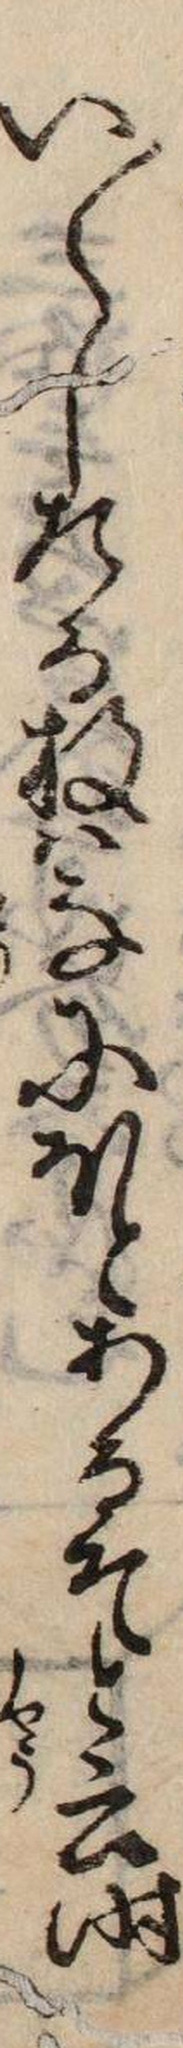い〳〵たる数はなにほとあるそと云時
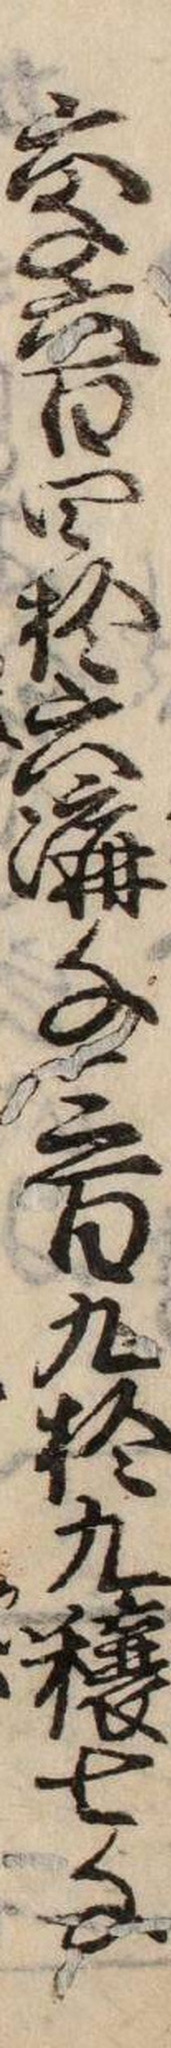六千六百四拾六溝千三百九拾七穰七千
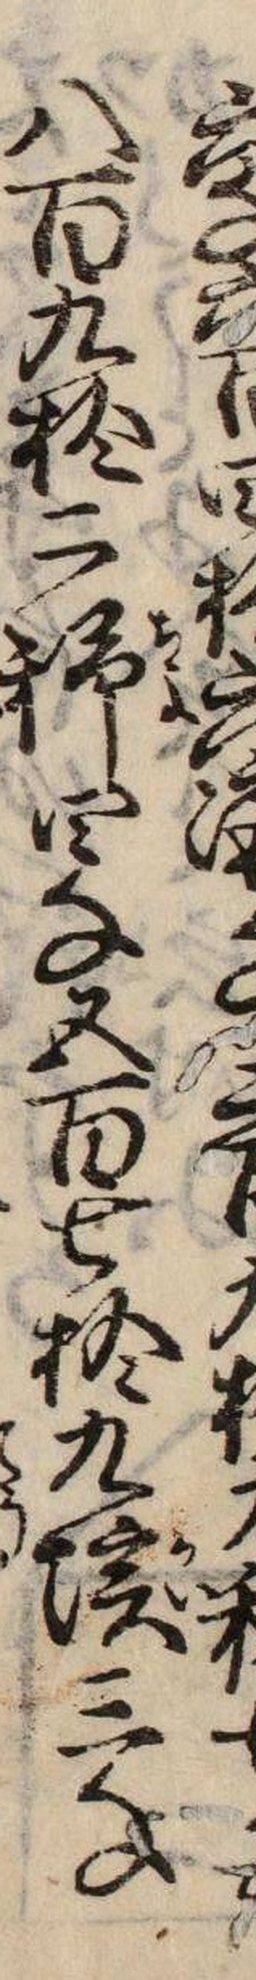八百九拾二杼四千五百七拾九垓三千
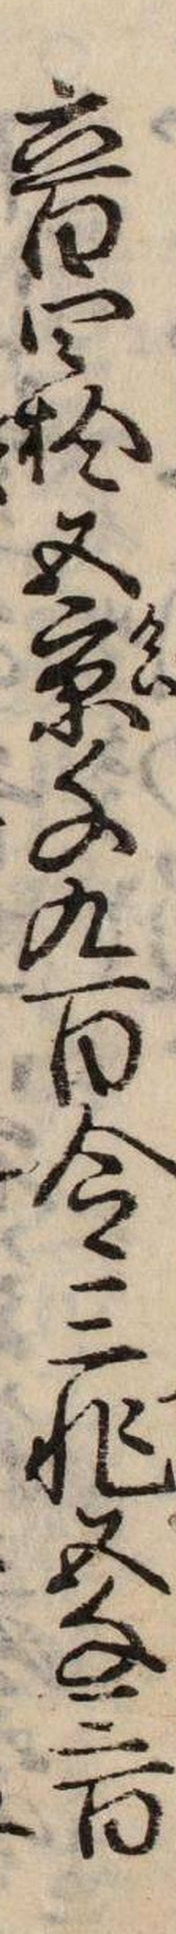六百四拾五京千九百令三兆五千三百
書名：塵劫記（寛永11年自跋、京都府立京都学・歴彩館追貴8）
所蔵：京都府立京都学・歴彩館 国文学研究資料館
